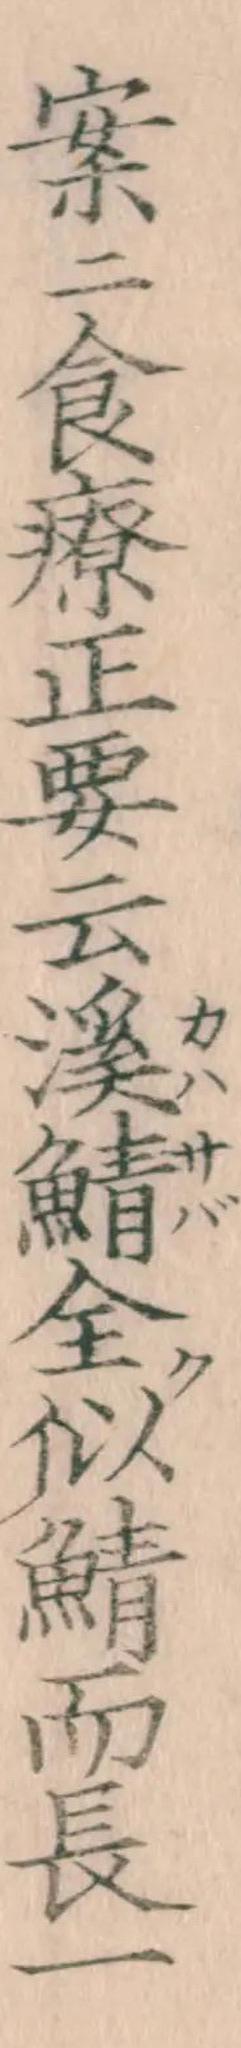案ニ食療正要云渓鯖全似鯖而長一
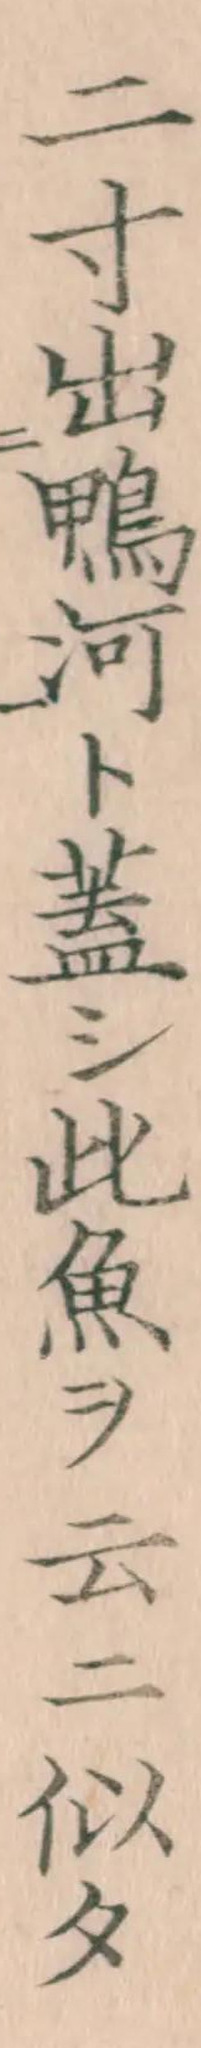ニ寸出鴨河ト蓋シ此魚ヲ云ニ似タ

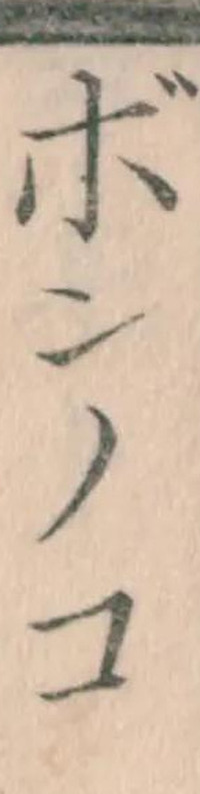ボンノコ
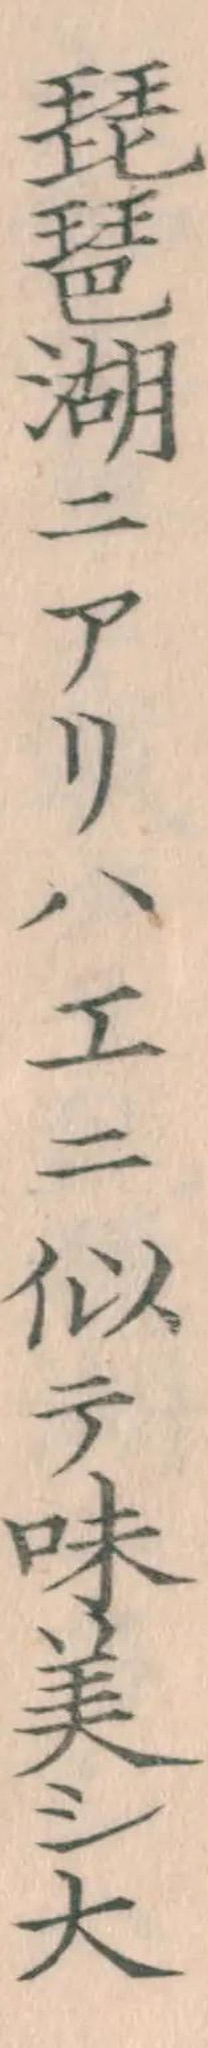琵琶湖ニアリハエニ似テ味美シ大
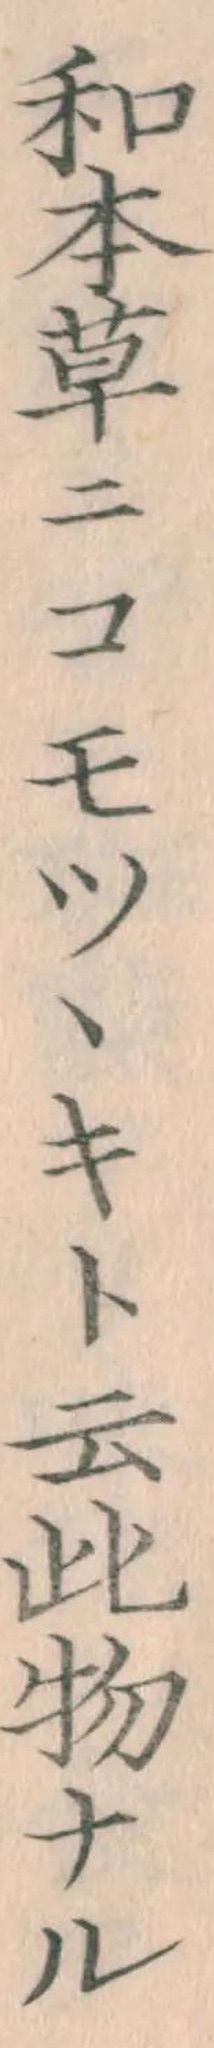和本草ニコモツヽキト云此物ナル
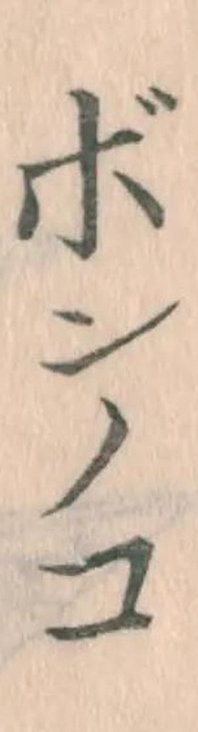ボンノコ
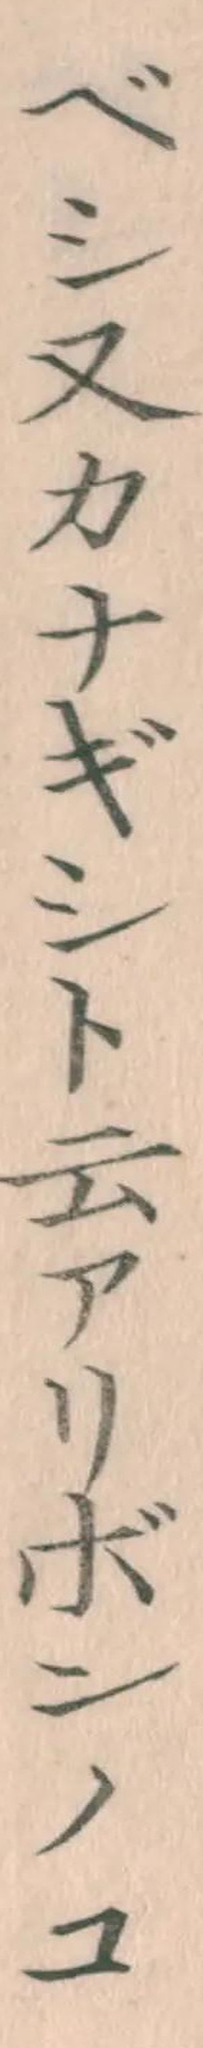ベシ又カナギシト云アリボンノコ
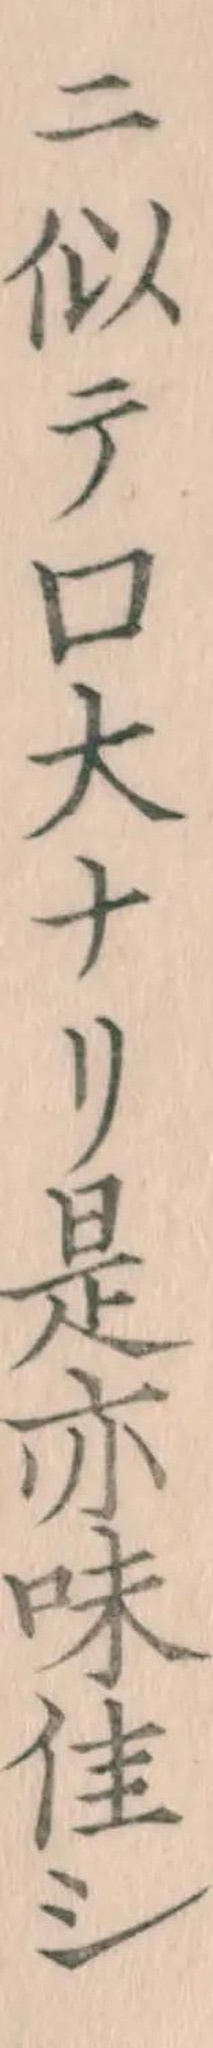ニ似テ口大ナリ是亦味佳シ
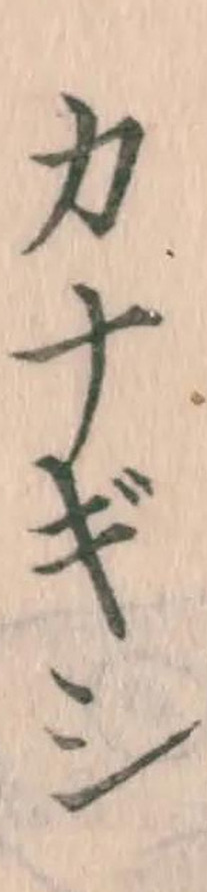カナギシ
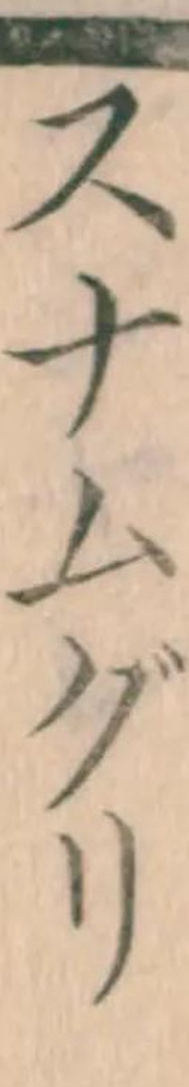スナムグリ
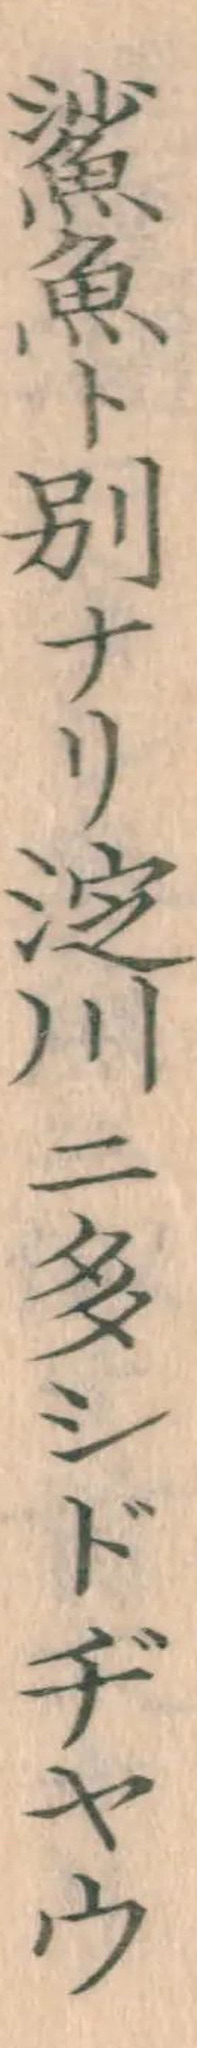鯊魚ト別ナリ淀川ニ多シドヂヤウ
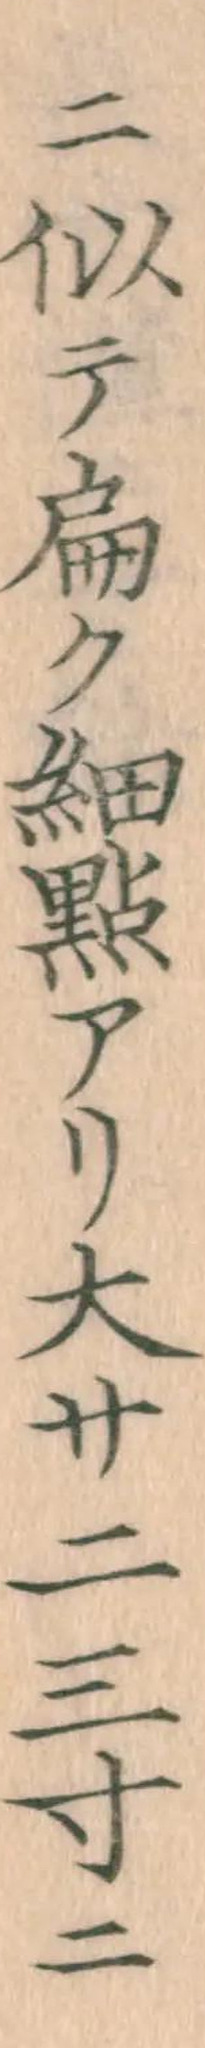ニ似テ扁ク細点アリ大サ二三寸ニ
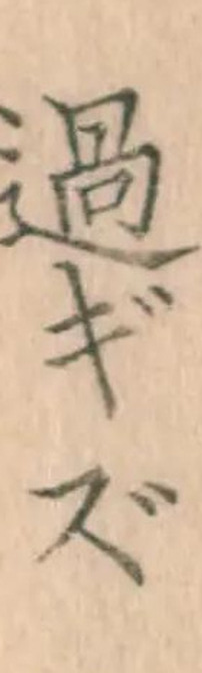過ギズ

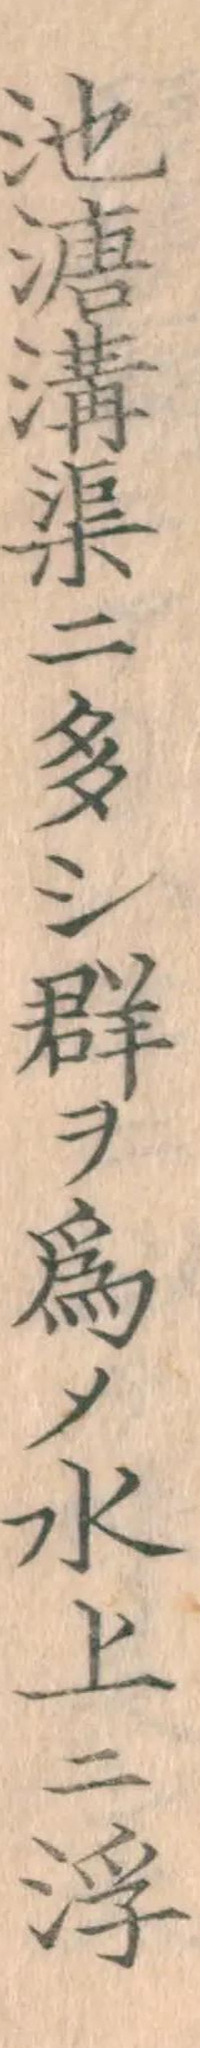池溏溝渠ニ多シ群ヲ為シテ水上ニ浮
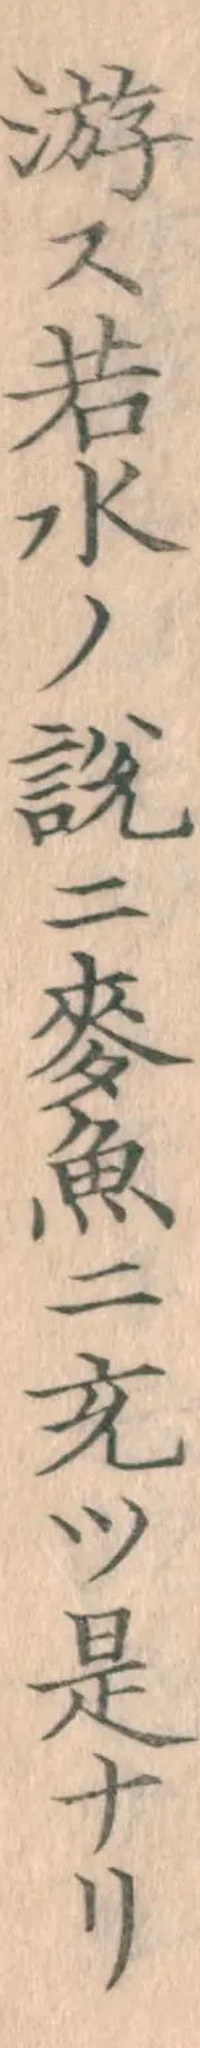游ス若水ノ説ニ麦魚ニ充ツ是ナリ
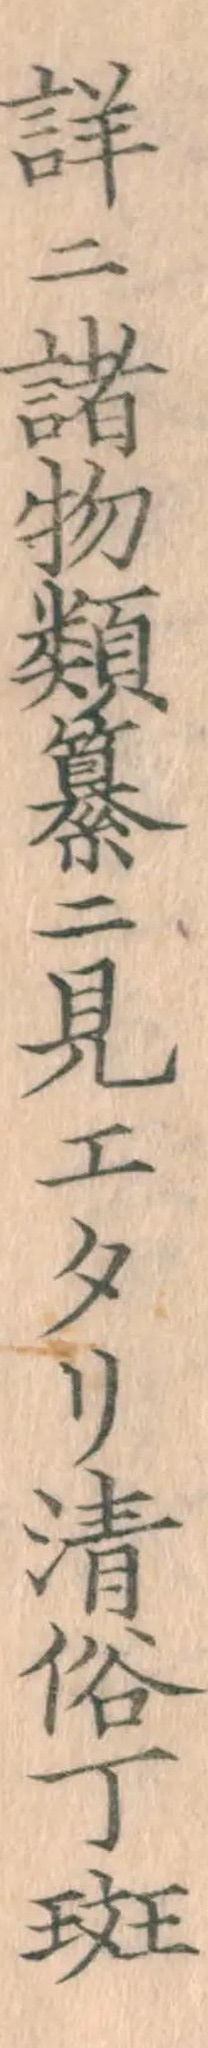詳ニ諸物類纂ニ見エタリ清俗丁斑
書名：皇和魚譜 2巻
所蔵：国立国会図書館 National Diet Library, JAPAN
